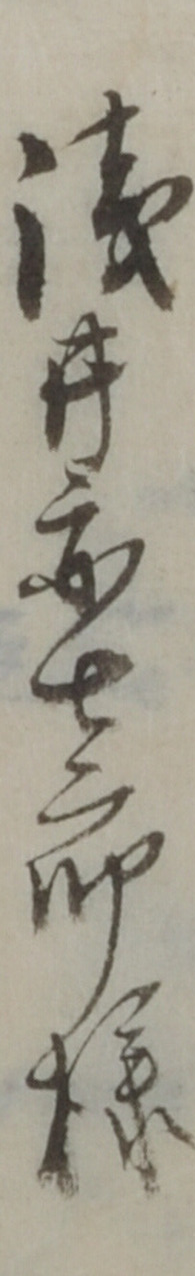浅井亦七郎様
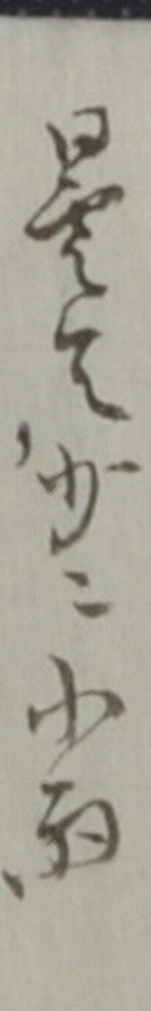曇天少ニ小雨
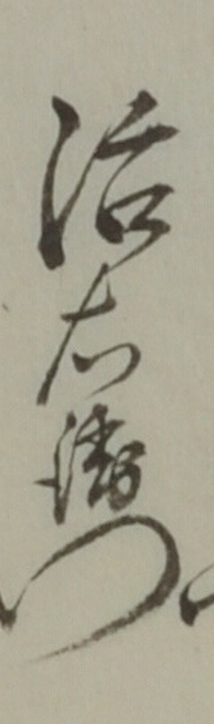同昼治右衛門
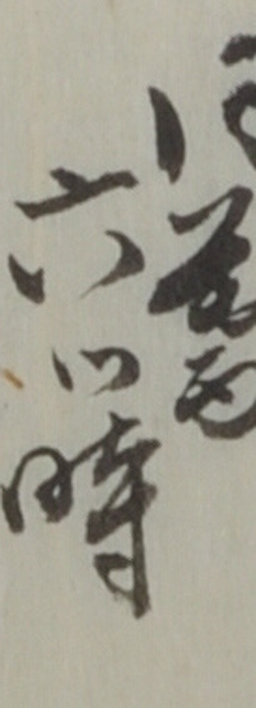六ツ時
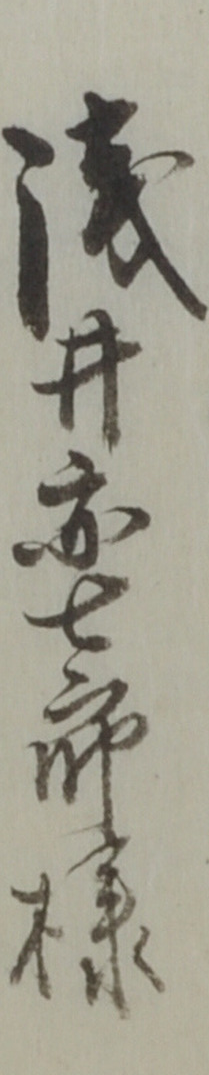浅井亦七郎様
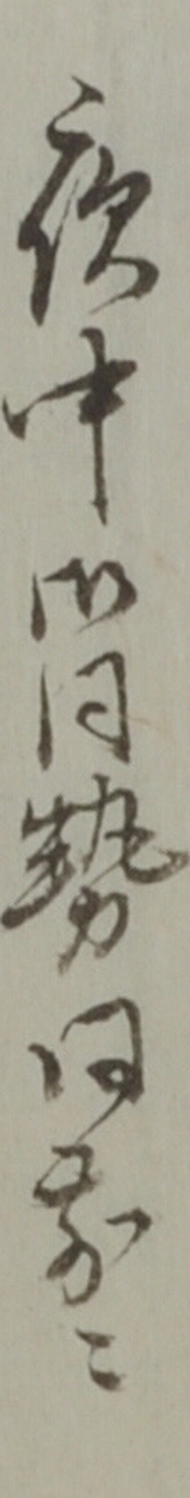夜中御同勢同前ニ
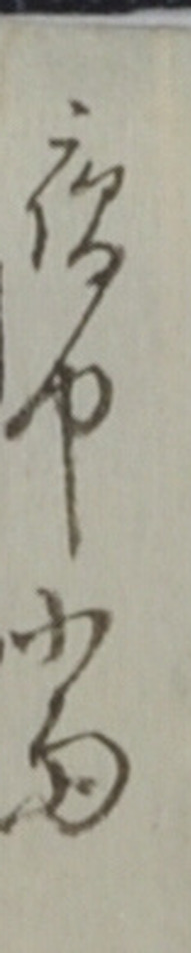夜中小雨
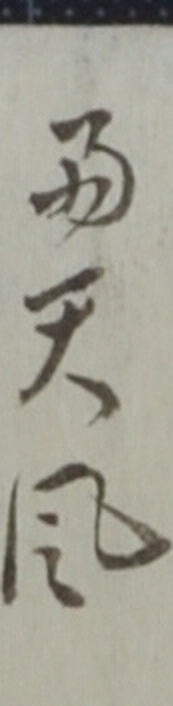雨天風

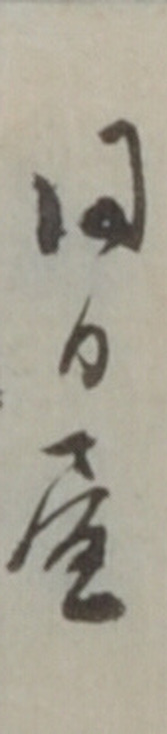同日昼
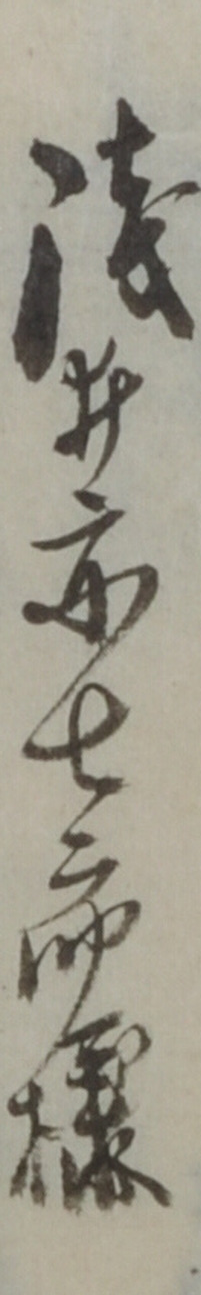浅井亦七郎様
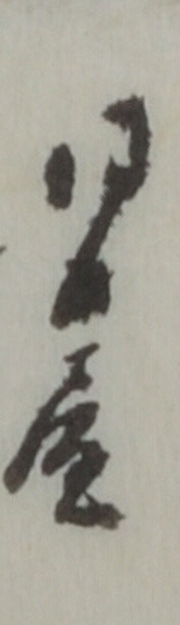同日昼
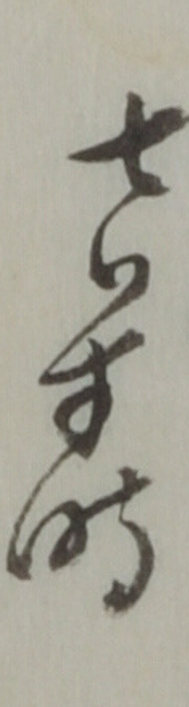四ツ半時
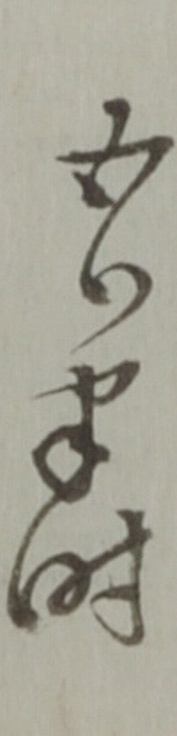四ツ半時
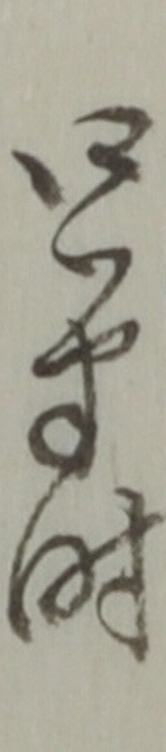四ツ半時
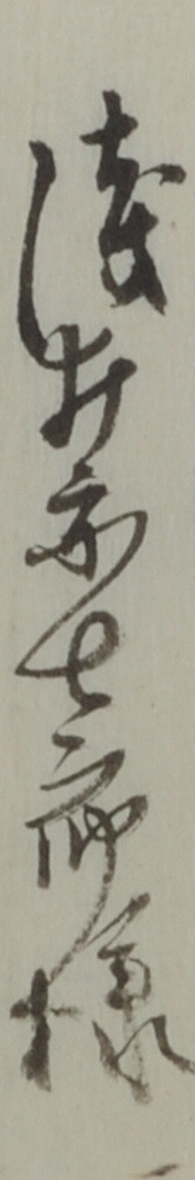浅井亦七郎様
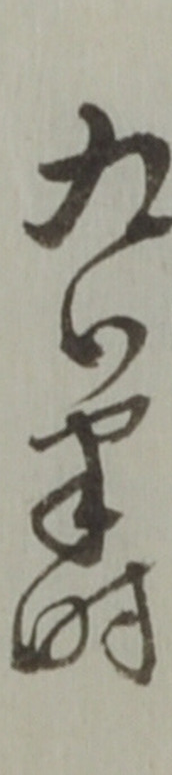四ツ半時
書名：日光御参詣ニ付町方警固番割名前控
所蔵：伊那市立高遠町図書館・合同会社AMANE
